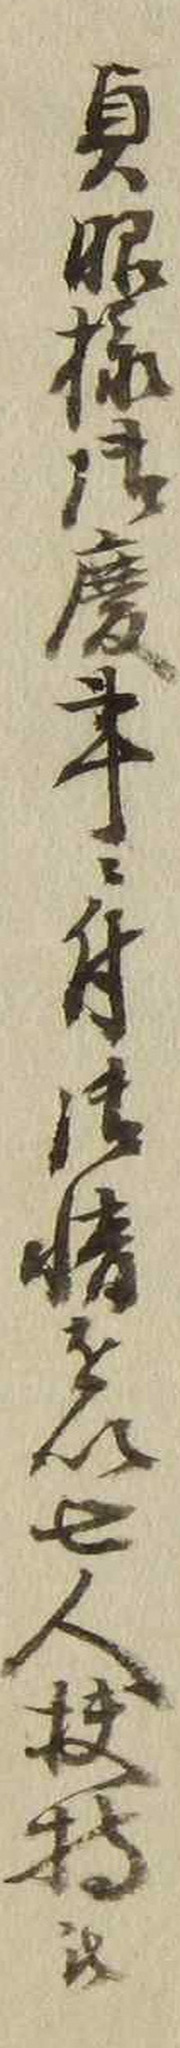貞昭様御慶事ニ付御情を以七人扶持被

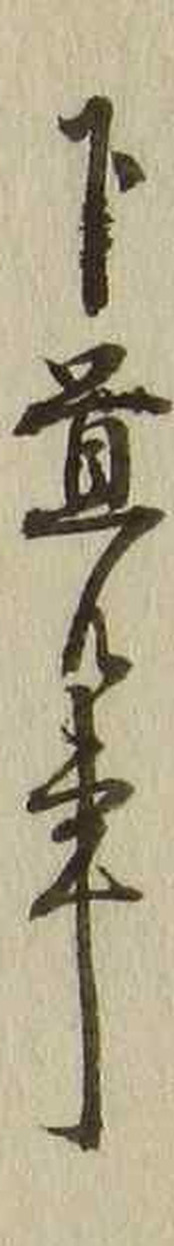下置候事
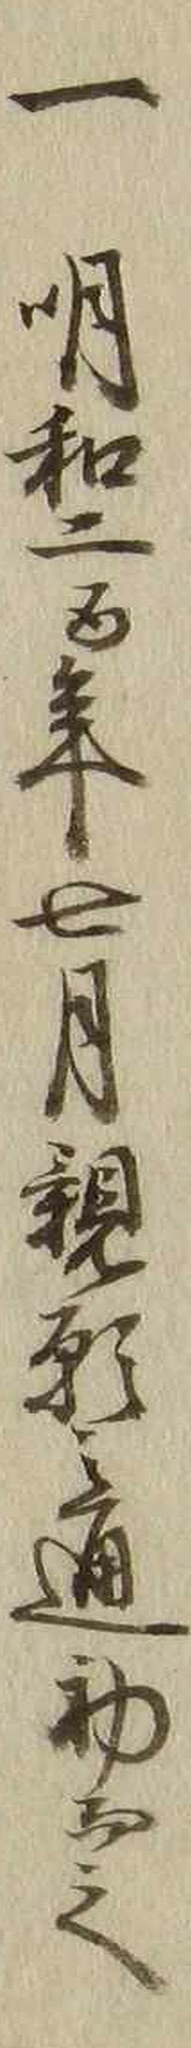一明和二酉年七月親願之通初而之
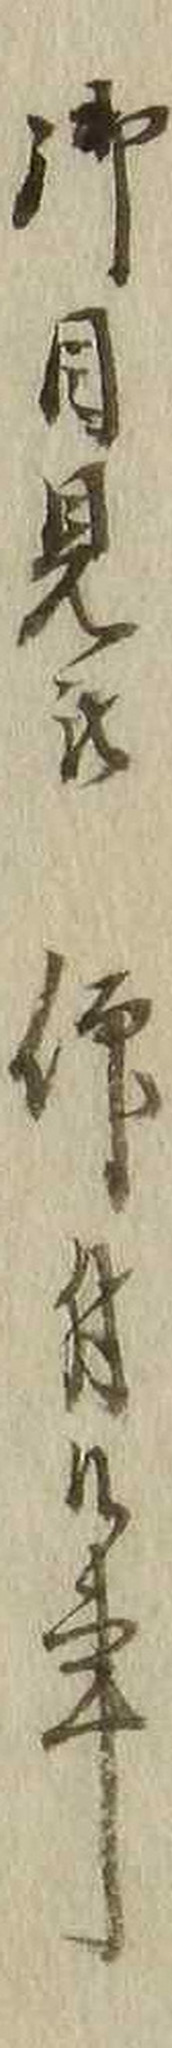御目見被仰付候事
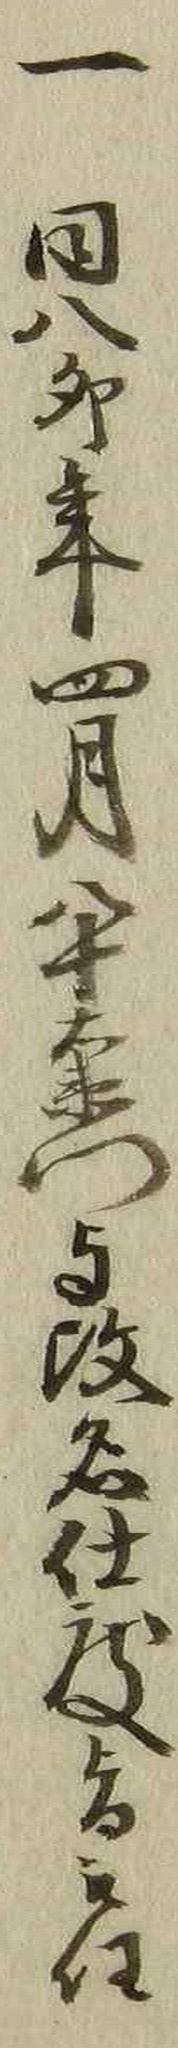一同八卯年四月八十右衛門与改名仕度旨被任
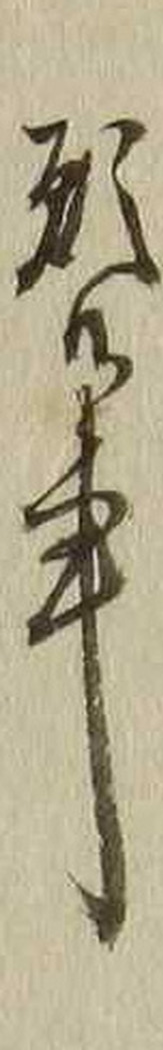願候事
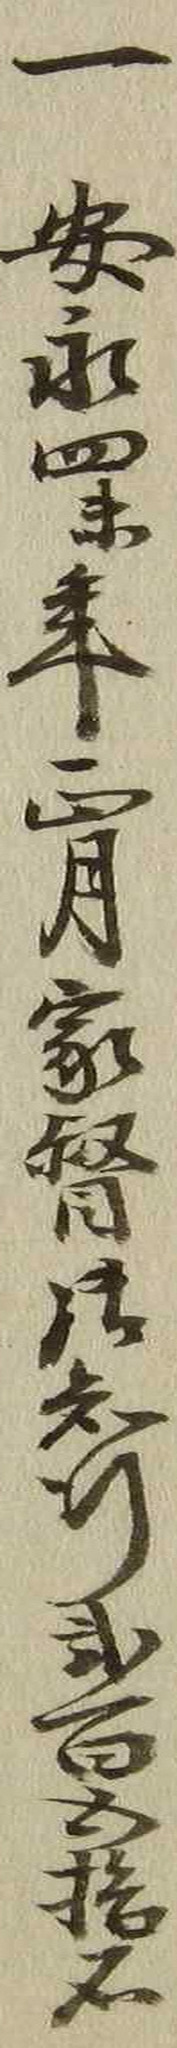一安永四未年正月家督御知行弐百五拾石
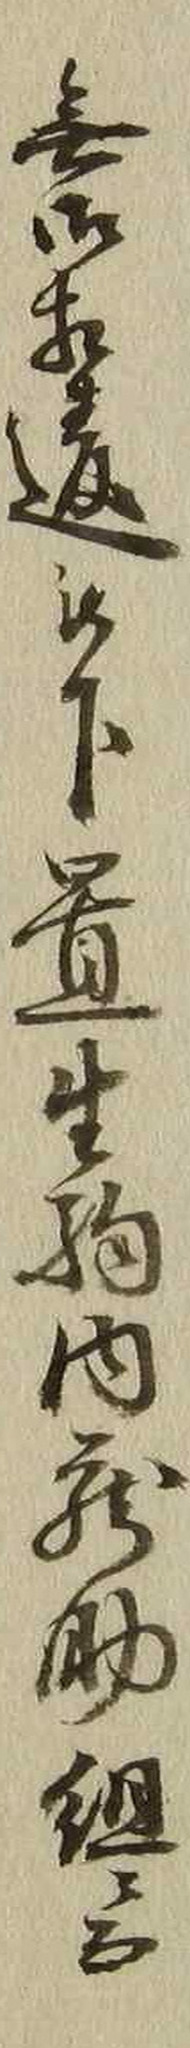無相違被下置生駒内蔵助組ニ而
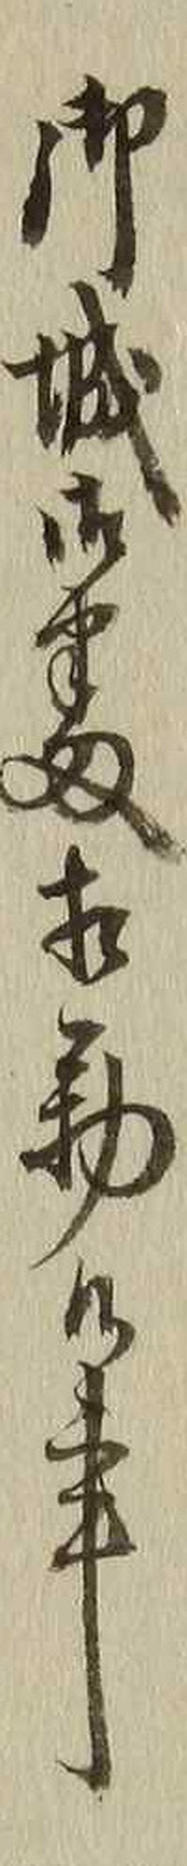御城御番相勤候事
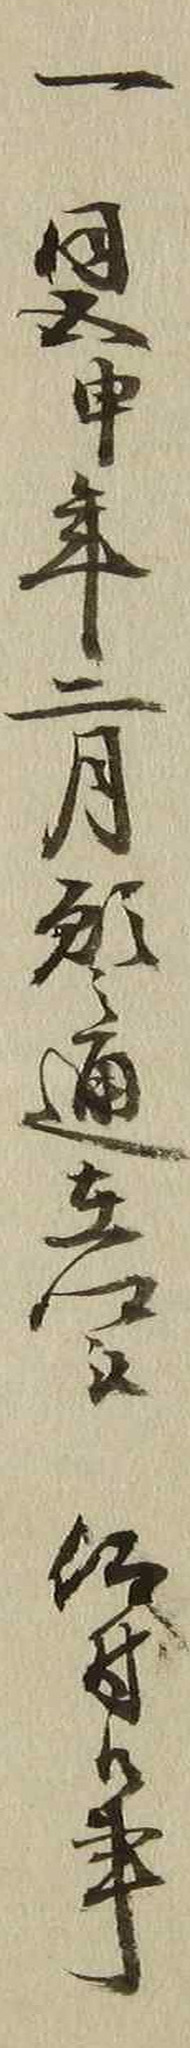一同五申年二月願之通在郷被仰付候事
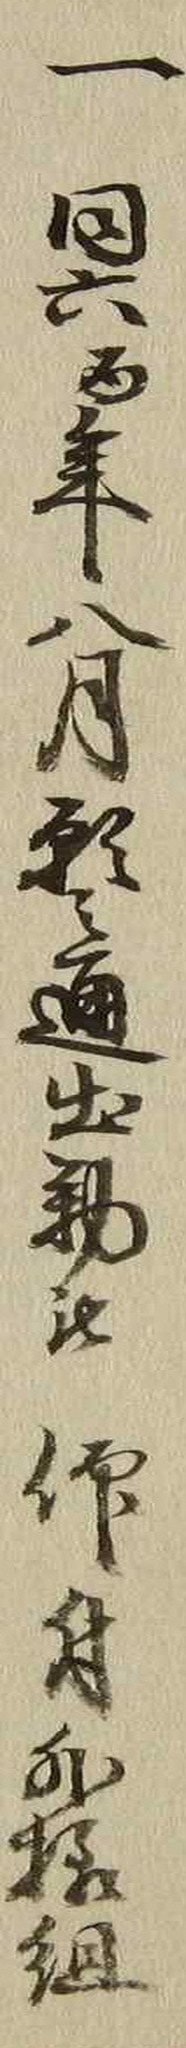一同六酉年八月願之通出勤被仰付外様組
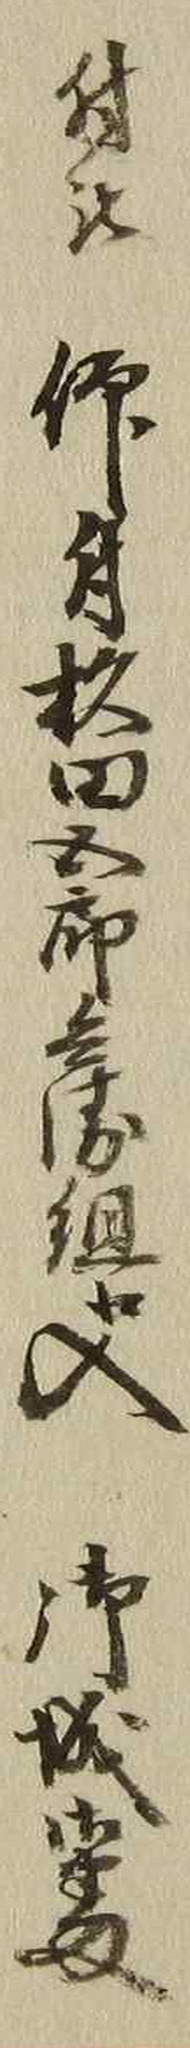付被仰付杉田五郎兵衛組江入御城御番
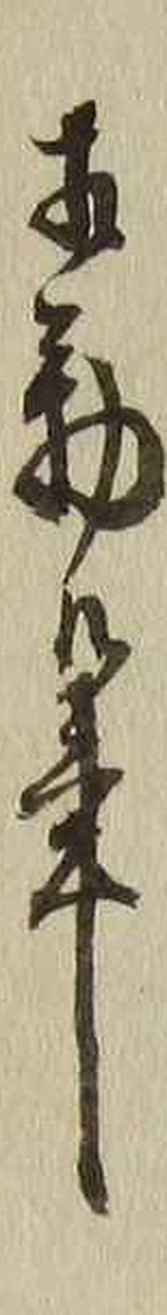相勤候事
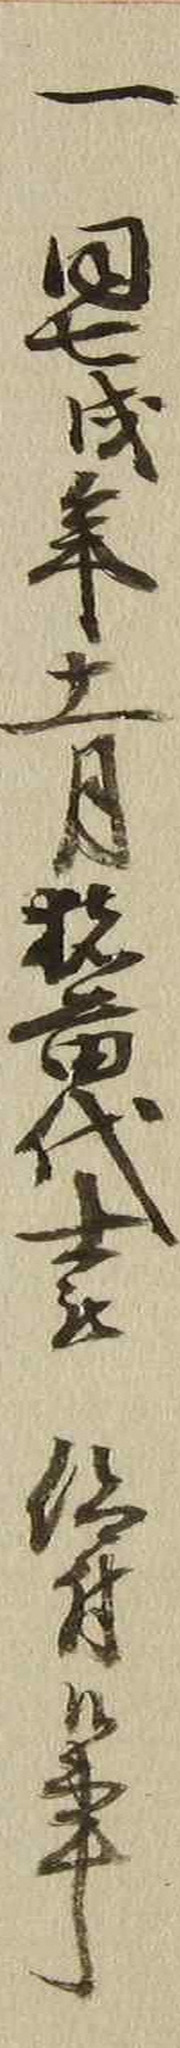一同七戌年十一月猪苗代士被仰付候事
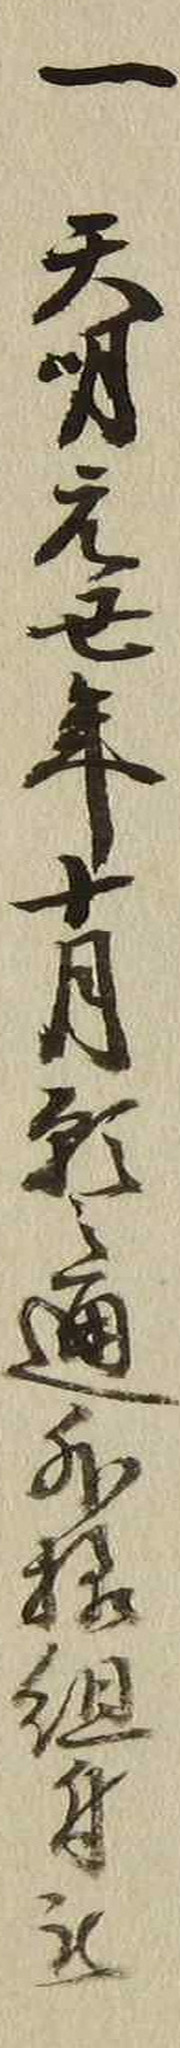一天明元丑年十月願之通外様組付被
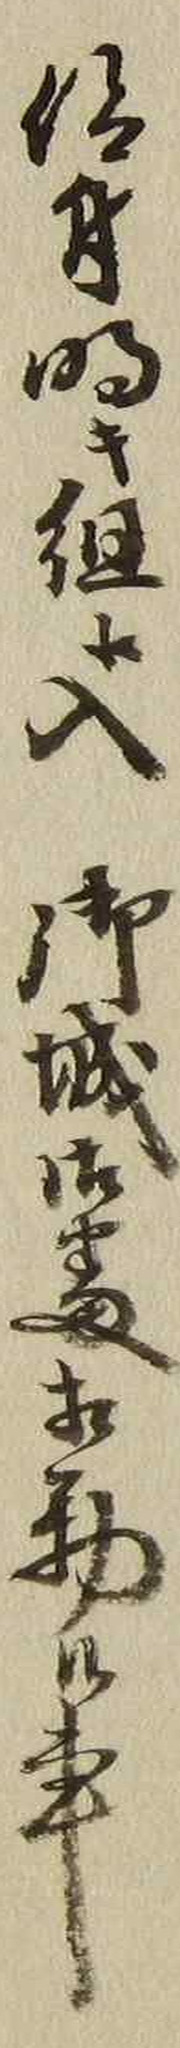仰付明キ組江入御城御番相勤候事
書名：諸士系譜　巻之64　と之部7
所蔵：会津若松市立会津図書館
